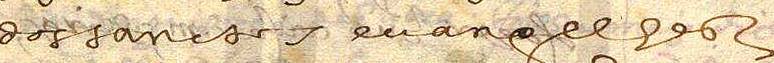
dos sanctos euangelhos
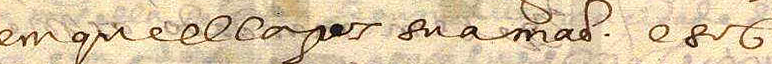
em que ella pos sua maõ. e sob
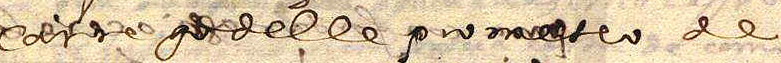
carrego delle prometeo de
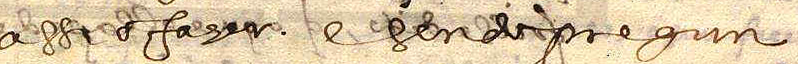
assi o fazer. e sendo pregun
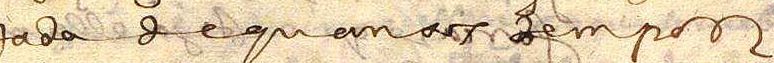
tada de quantos tempos
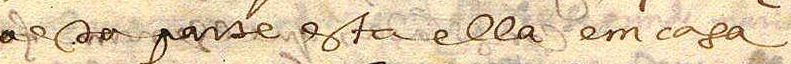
a esta parte esta ella em casa
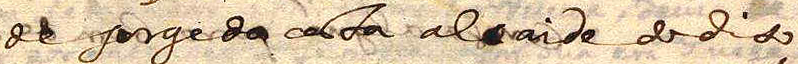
de jorge da costa alcaide do dito
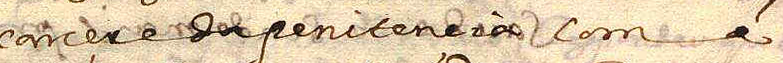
carçere da penitençia com a
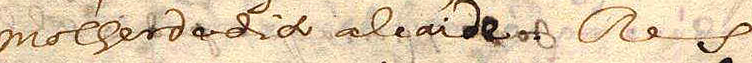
molher do dito alcaide. Res
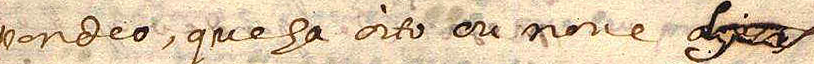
pondeo, que ha oito ou noue djas
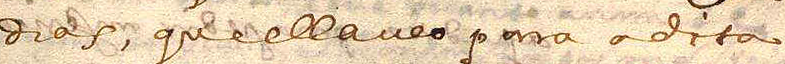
dias, que ella ueo para a dita
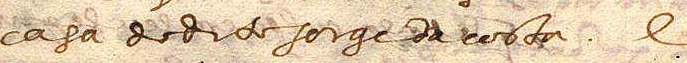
casa do dito Jorge da costa. E
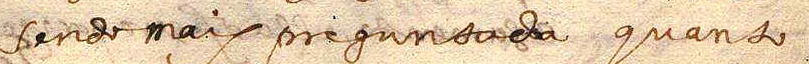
sendo mais preguntada. quanto
